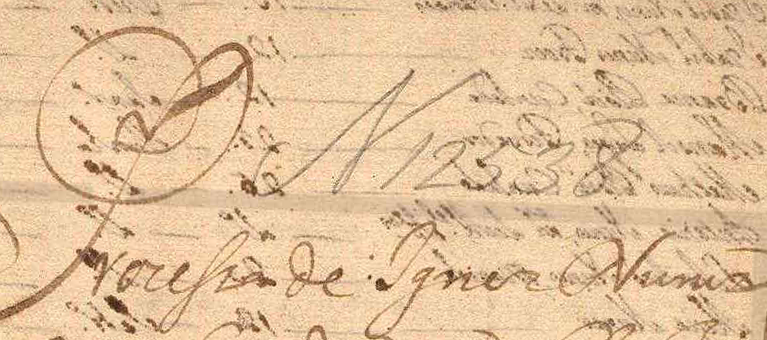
Processo de Ignez Nuniz
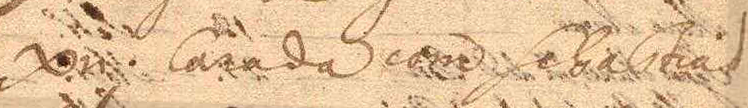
x. n. cazada com sebastiaõ
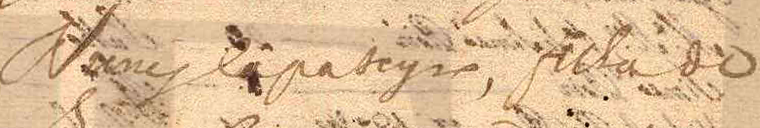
Nunes Capateyro, filha de
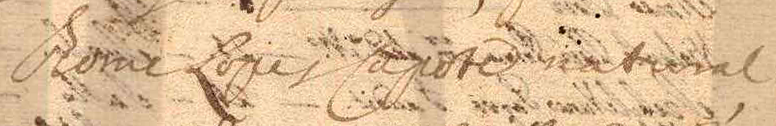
Thome Lopes Capote natural
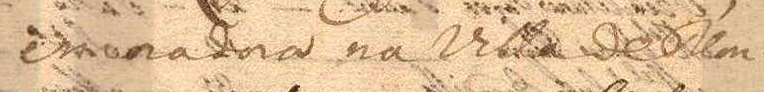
e moradora na Villa de Mon
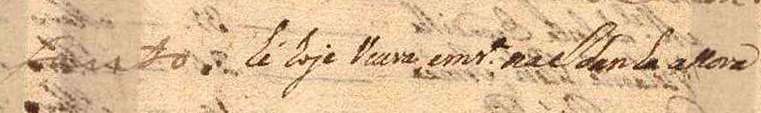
santo hé hoje Veuva e mr.a na Idanha a Nova
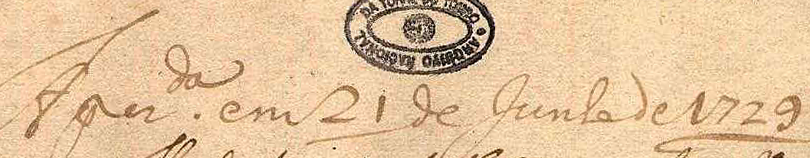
Aprezda. em 21 de Junho de 1729
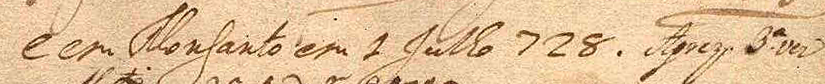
e em Monsanto em 1 Julho 728. Aprez. 3.a vez
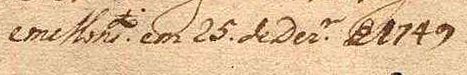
em Mons.to em 25. de Dez.r d̄ 1749
